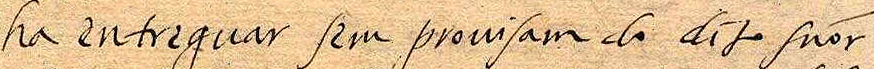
ha entreguar sem prouisam do dito snor̄
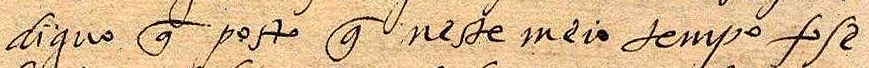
diguo q̄ posto q̄ neste medio tempo fose
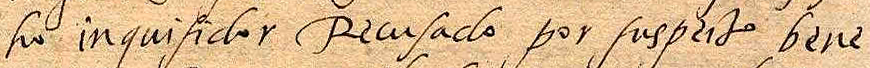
ho inquisidor Recusado por suspeito bene
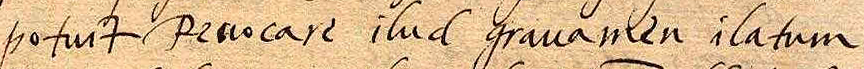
potuit Reuocare ilud grauamen ilatum
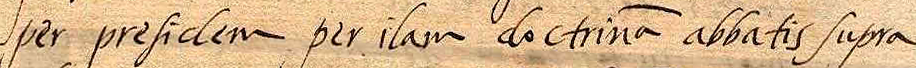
per presidem per ilam doctrinā abbatis supra
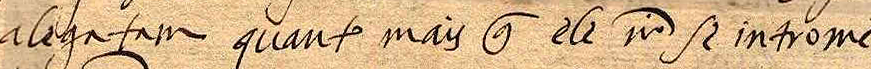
alegatam quanto mais q̄ ele nō se introme
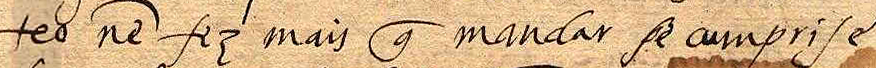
teo nē fez mais q̄ mandar se cumprise
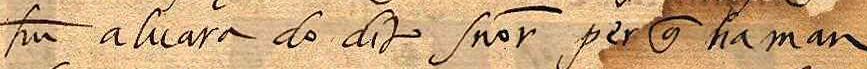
hū aluara do dito snor̄ per q̄ ha man
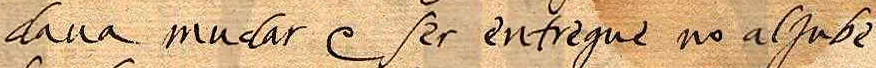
daua mudar e ser entregue no alJube
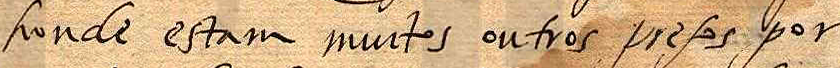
honde estam muitos outros presos por
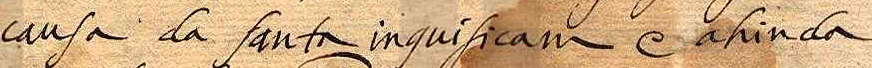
causa da santa inquisiçam e ahinda
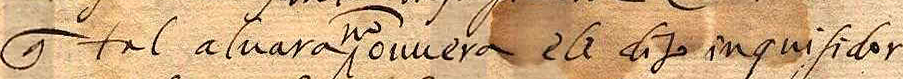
q̄ tal aluara nō ouuera ele dito inquisidor
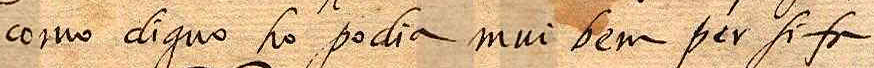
como diguo ho podia mui bem per si fa
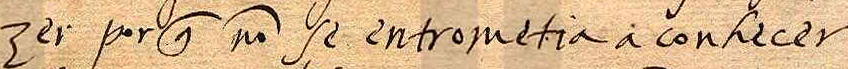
zer porq̄ nō se entrometia a conhecer
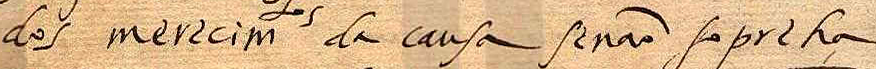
dos merecimtos da causa senão sopre ha
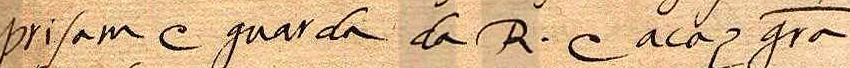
prisam e guarda da R. e açaz ḡra
